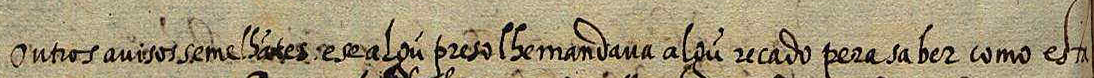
outros auisos semelhātes. e se algū preso lhe mandaua algū recado pera saber como esta
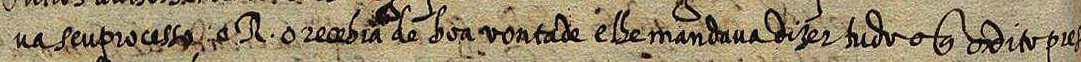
ua seu processo o R. o recebia de boa vontade e lhe mandaua dizer tudo o q̄ o dito preso
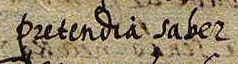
pretendia saber.
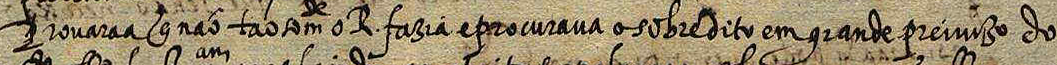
Prouaraa q̄ naõ taõ somte o R. fazia e procuraua o sobredito em grande preiuizo do
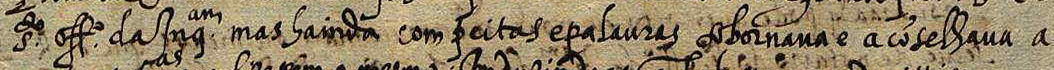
s.to off.o da Jnq.am mas hainda com peitas e palauras sobornaua e acōselhaua a
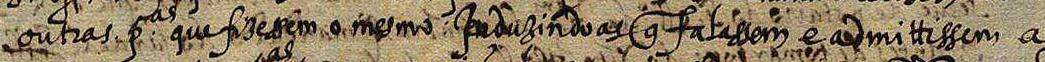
outras p.as que fizessem o mesmo. Jnduzindo as q̄ falassem e admittissem a
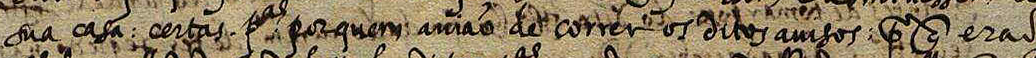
sua casa : certas pas. por quem auiaõ de correr os ditos auisos p̄oq̄ eraõ
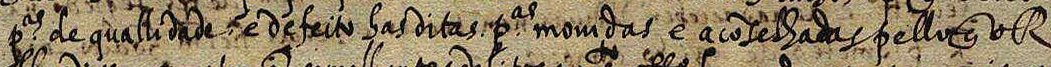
pas. de quallidade e de feito has ditas p.as mouidas e acōselhadas pello q̄ o R
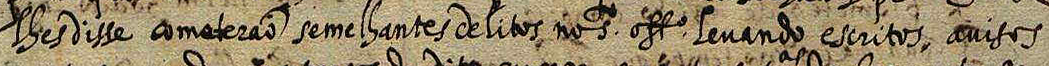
lhes disse cometeraõ semelhantes delitos no s.to offo. leuando escritos, auisos
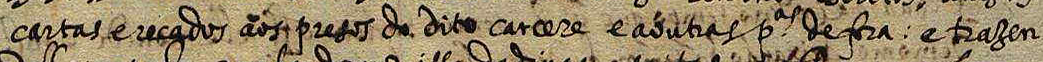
cartas e recados aos presos do dito carcere e a outras pas de fora: e trazen
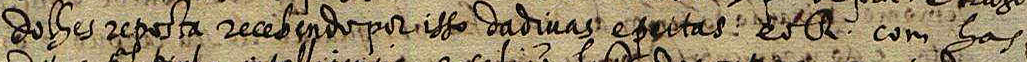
dolhes reposta recebendo por isso dadiuas e peitas: e o R. com has
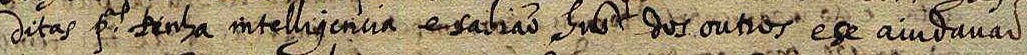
ditas pas. tinha intelligencia e sabiaõ hus̄ dos outros e se aiudauaõ
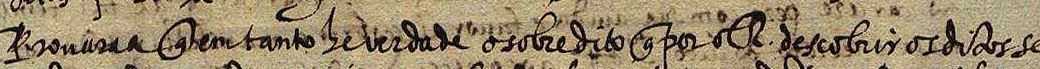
Prouaraa q̄ em tanto he verdade o sobredito q̄ por o R. descobrir os ditos se
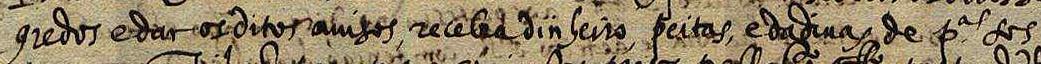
gredos e dar os ditos auisos, recebia dinheiro, peitas, e dadiuas de pas sos
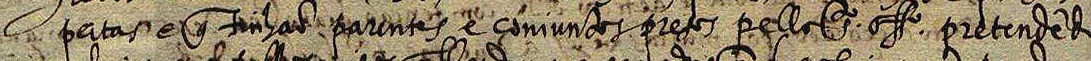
peitas e q̄ tinhaõ parentes e coniuntos presos pello s.to offo. pretendēdo
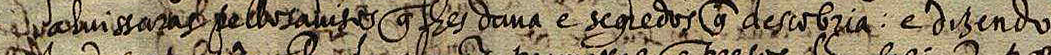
aluissaras pellos auisos q̄ lhes daua e segredos q̄ descobria: e dizendo
